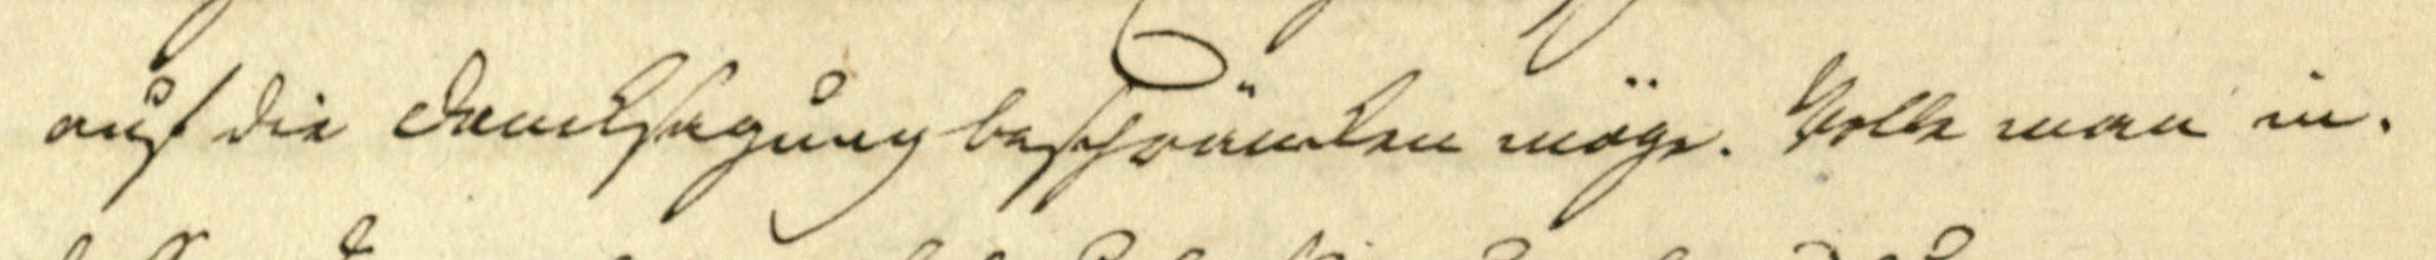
auf die Dancksagung beschräncken möge. Wolle man in¬
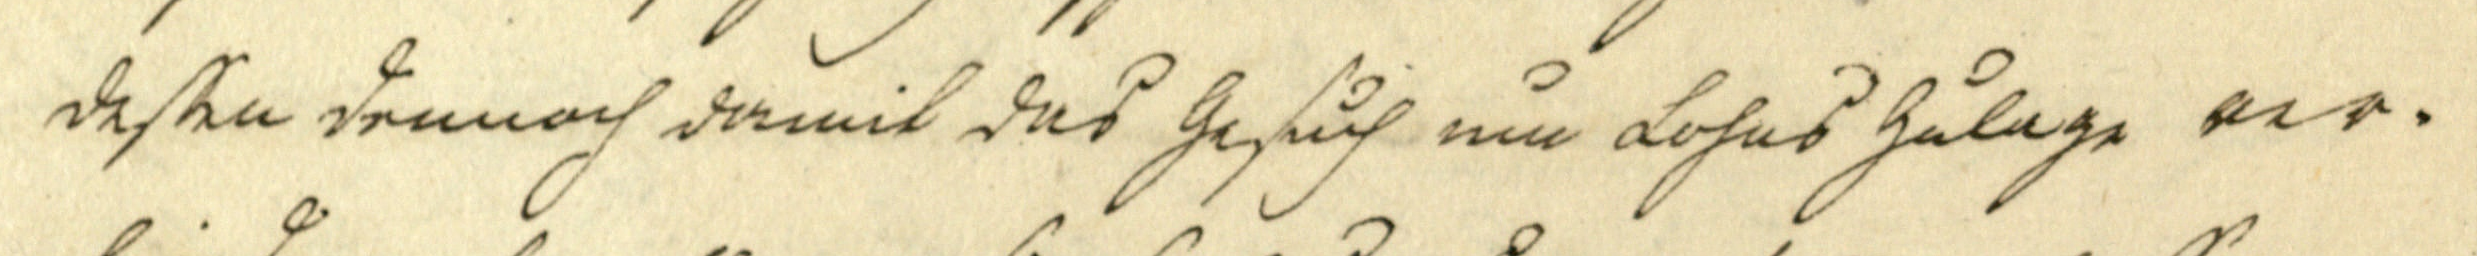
dessen dennoch damit das Gesuch um Lohns Zulage ver¬
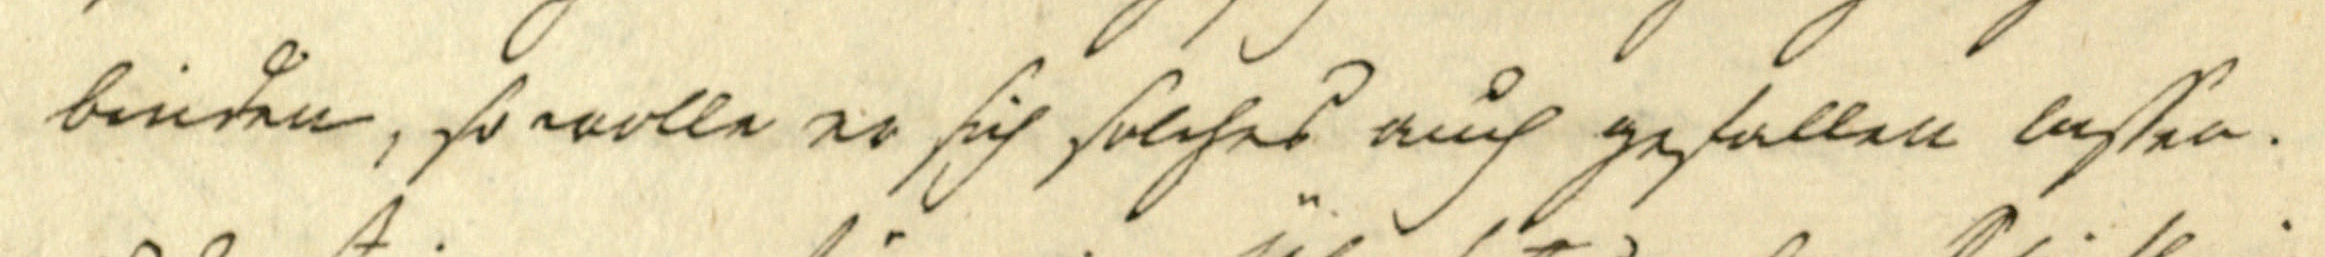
binden, so wolle er sich solches auch gefallen lassen.
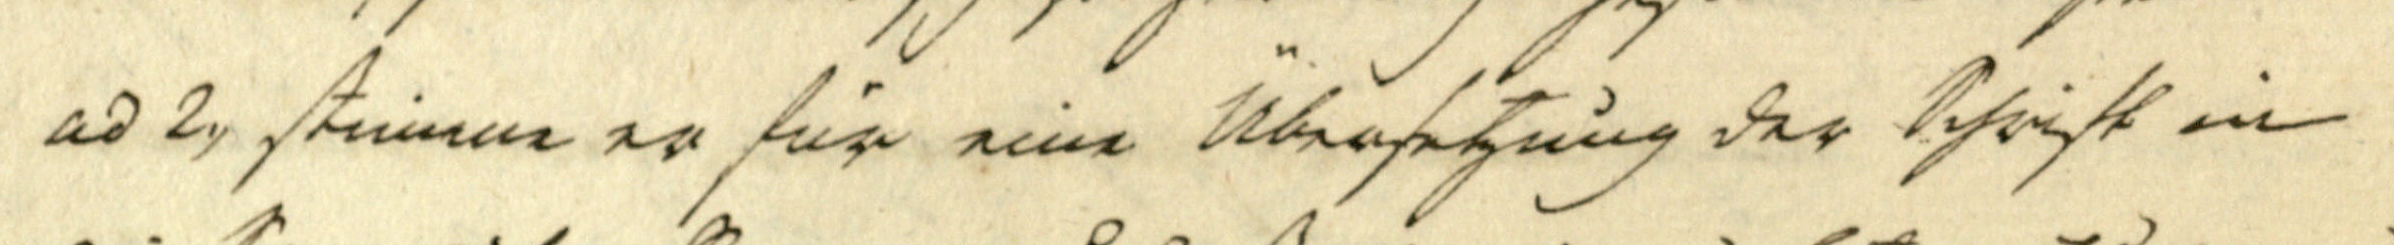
ad 2., stimme er für eine Übersetzung der Schrift in
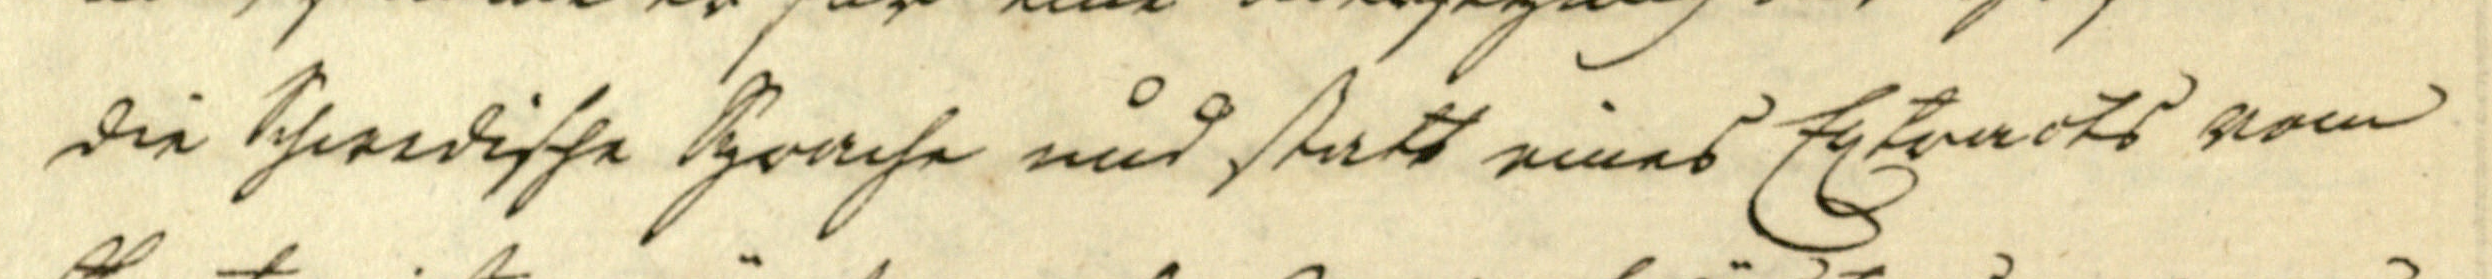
die Schwedische Sprache und statt eines Extracts vom
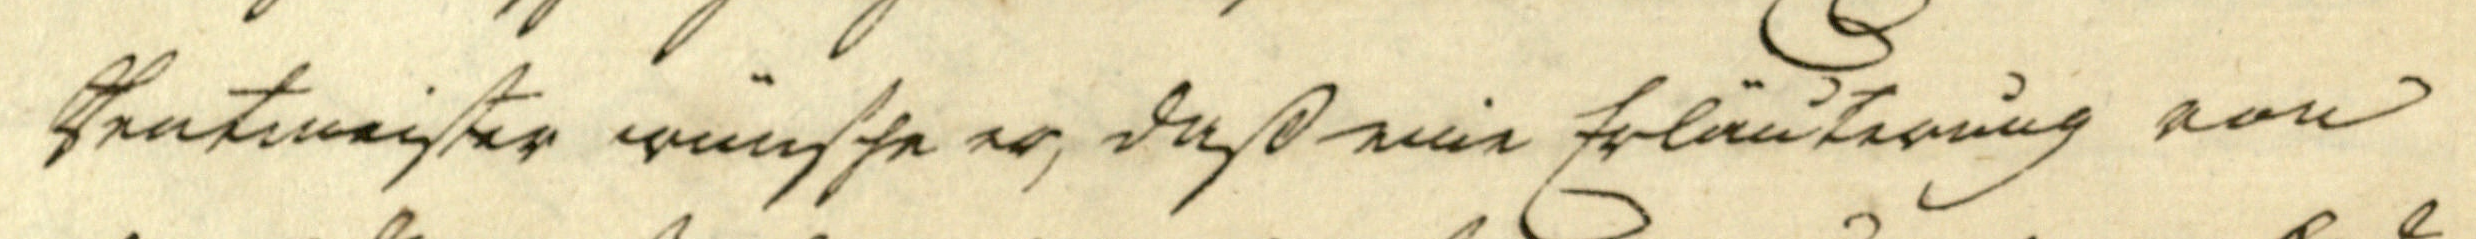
Rentmeister wünsche er, daß eine Erläuterung von
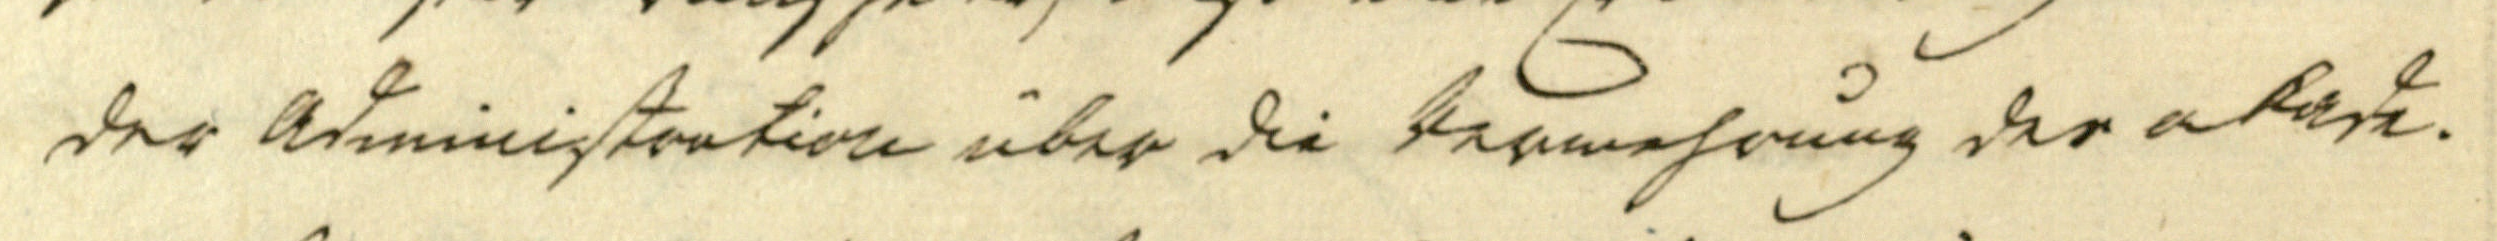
der Administration über die Vermehrung der akade¬
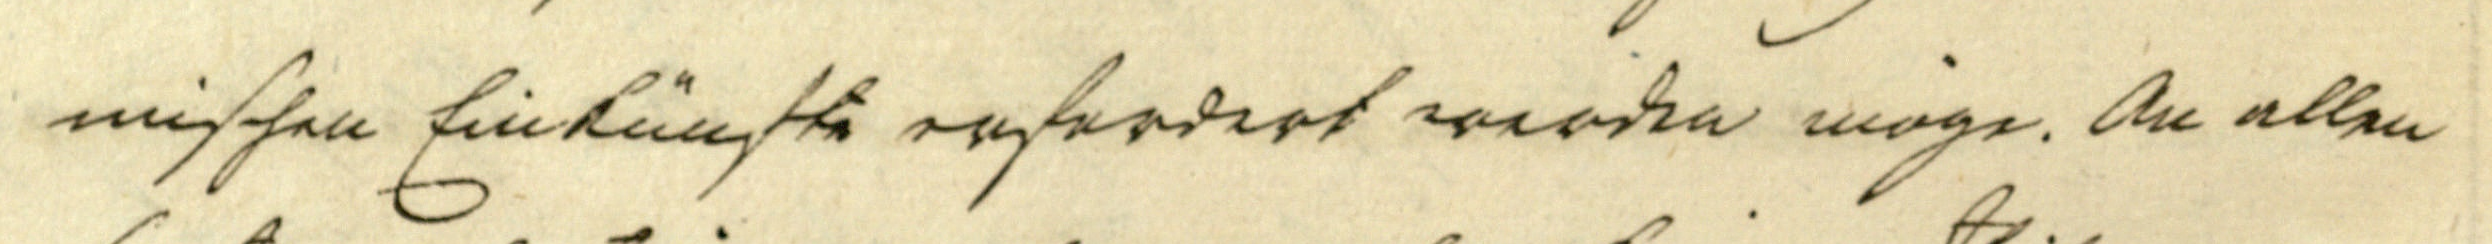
mischen Einkünfte erfordert werden möge. An allen
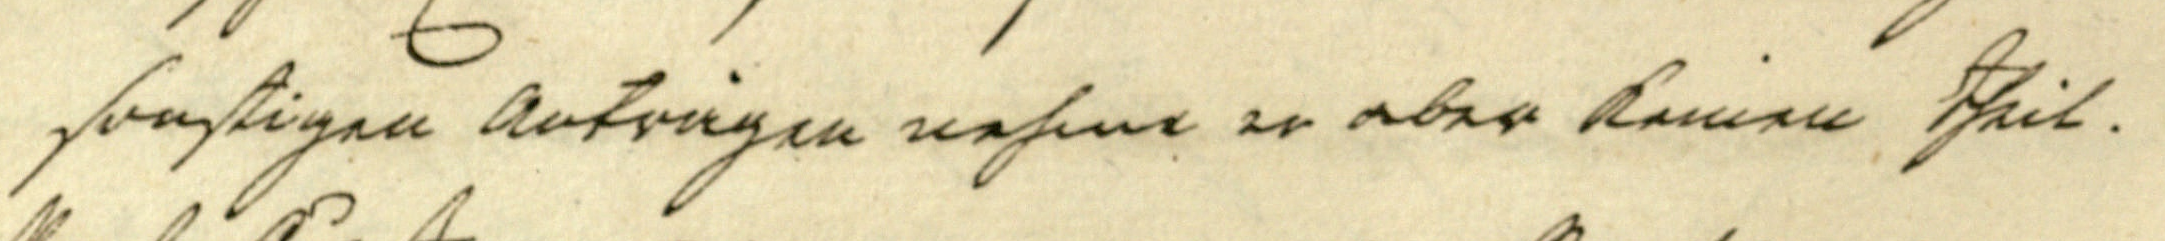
sonstigen Anträgen nehme er aber keinen Theil.
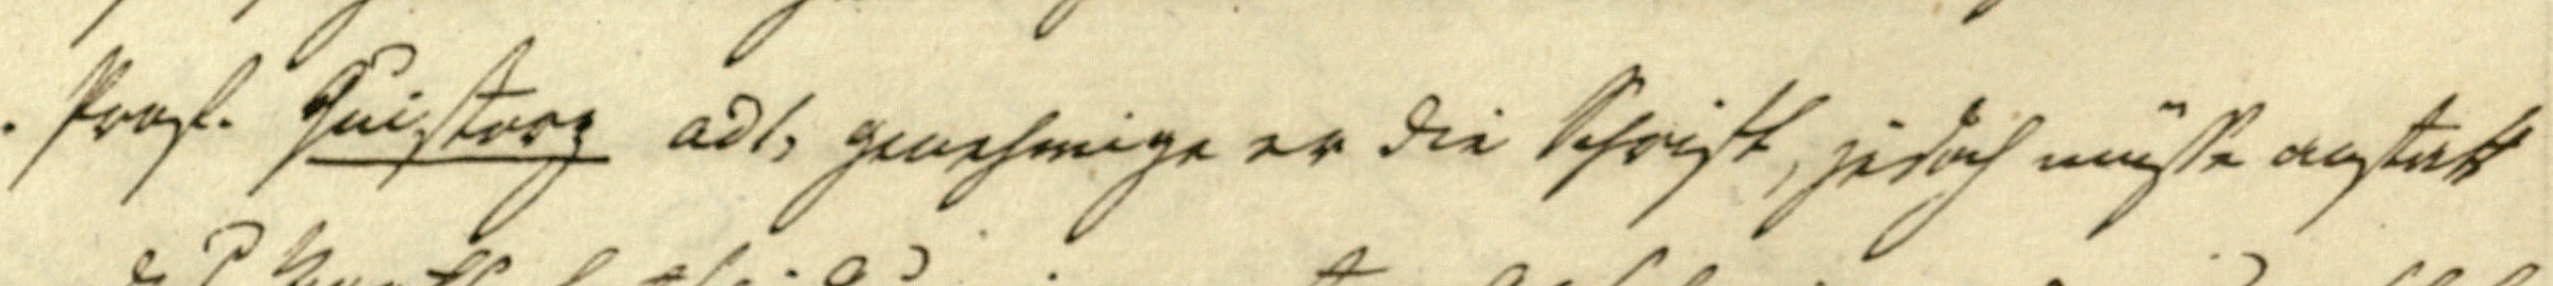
Prof. Quistorp ad 1, genehmige er die Schrift, jedoch müsse anstatt
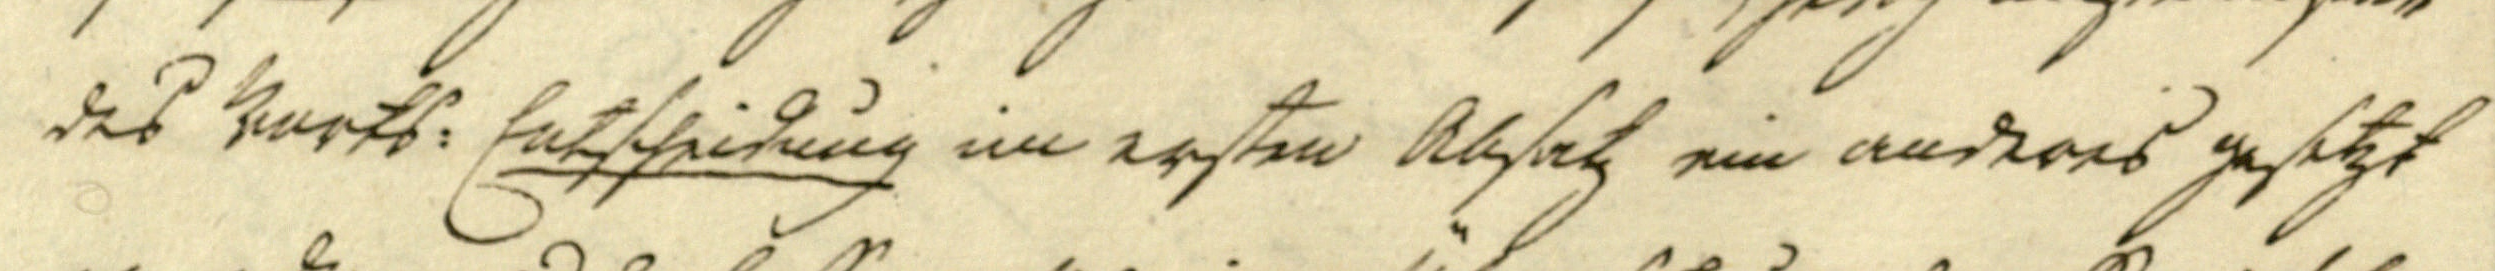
des Worts: Entscheidung im ersten Absatz ein anderes gesetzt
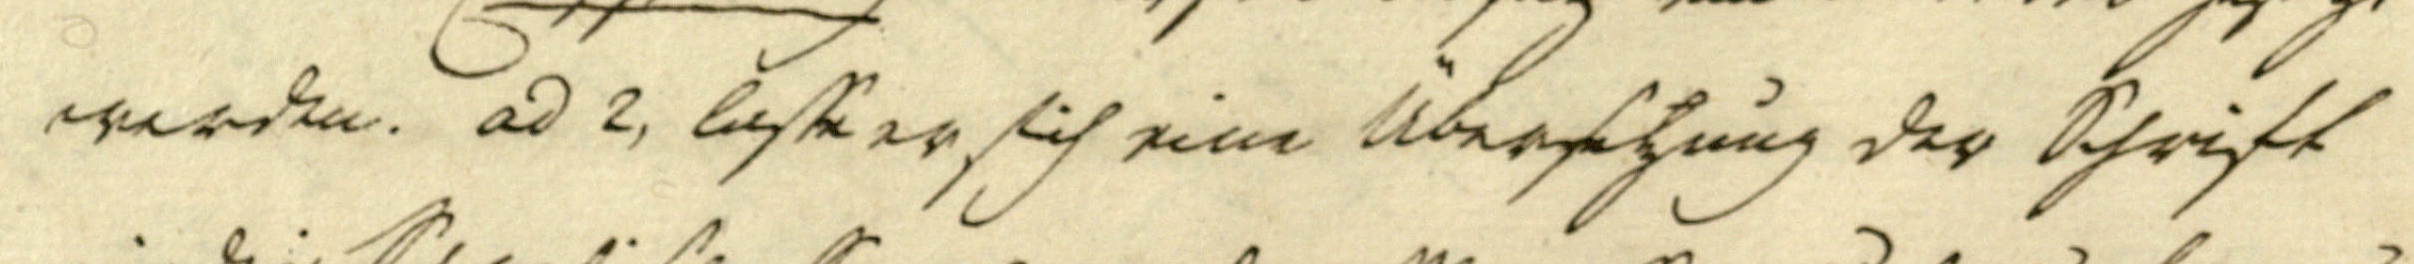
werden. ad 2, lasse er sich eine Übersetzung der Schrift
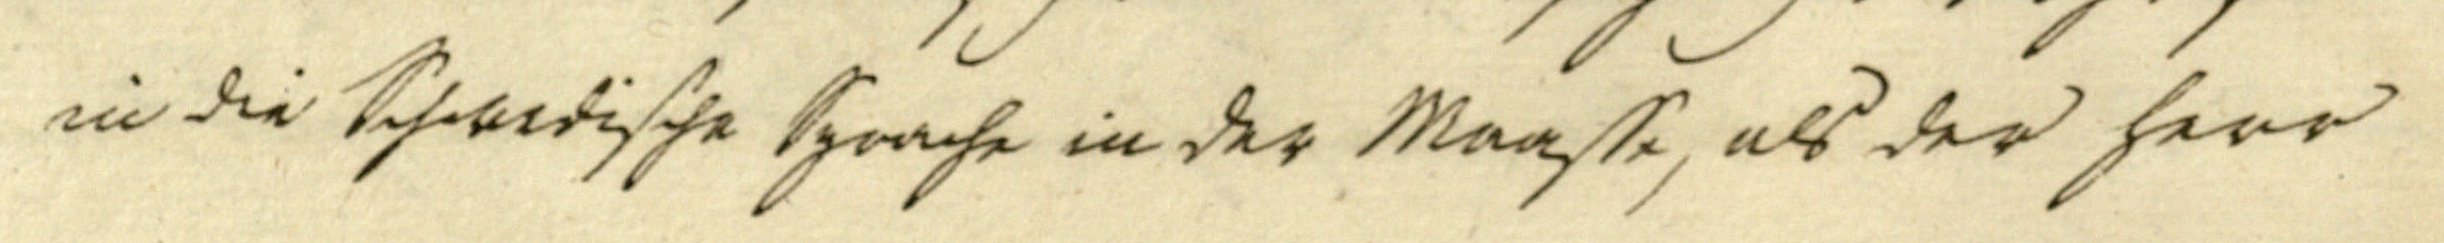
in die Schwedische Sprache in der Maasse, als der Herr
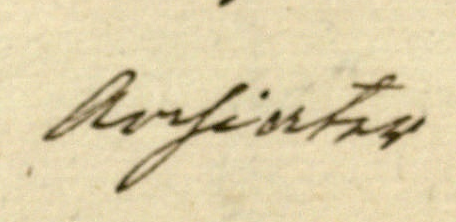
Archiater
